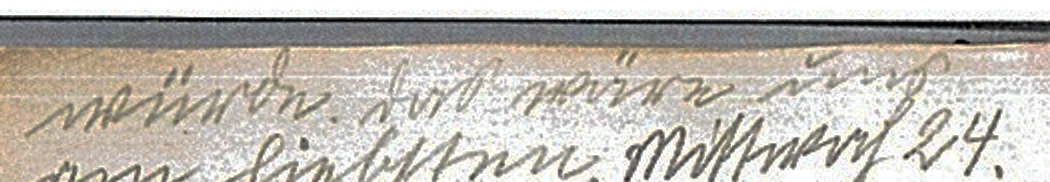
würde das wäre uns
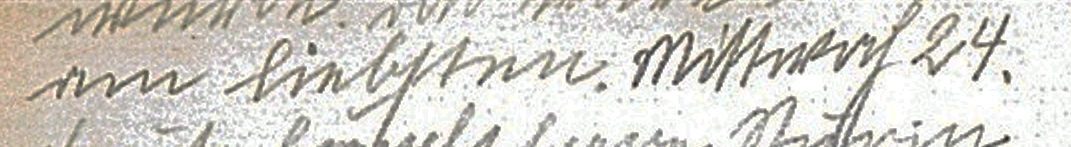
am liebsten. Mittwoch 24.
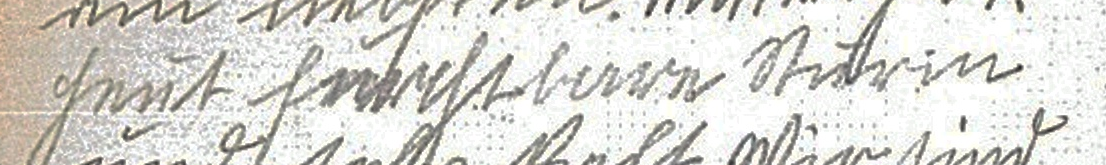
Heut furchtbarer Sturm
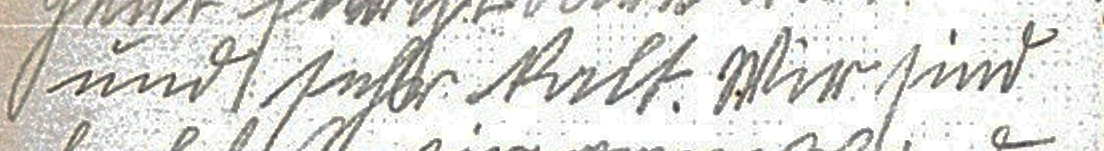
und sehr kalt. Wir sind
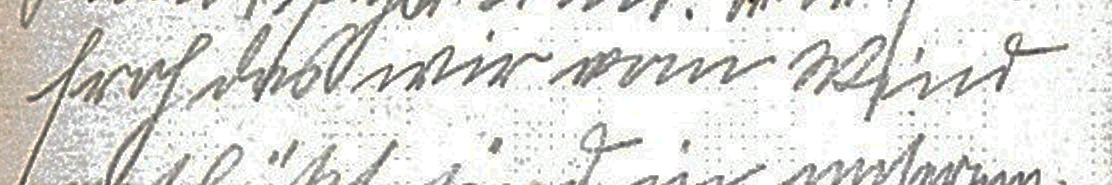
froh das wir vom Wind
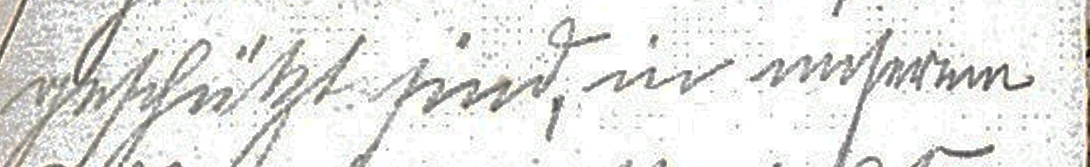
geschützt sind, in unserem
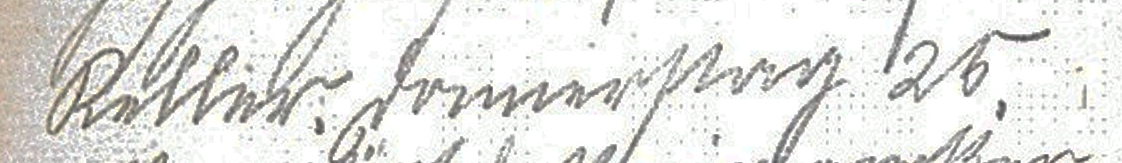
Keller. Donenrstag 25.
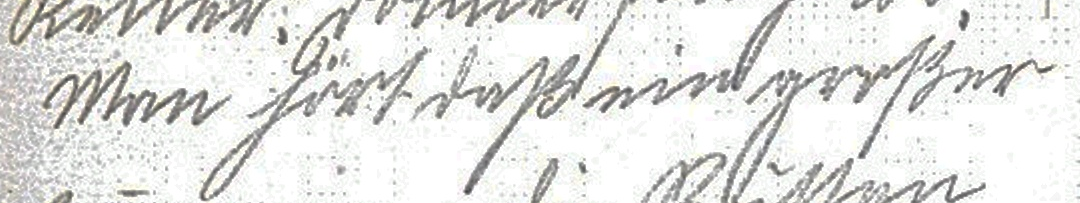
Man hört daß ein großer
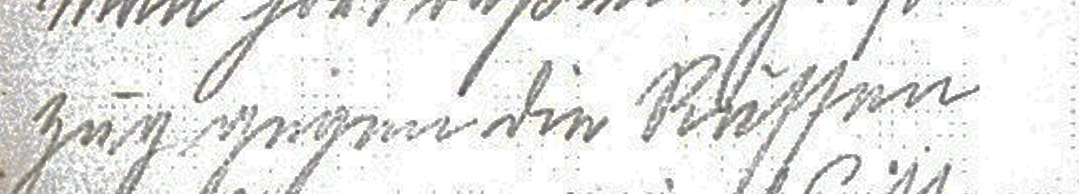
Zug gegen die Russen
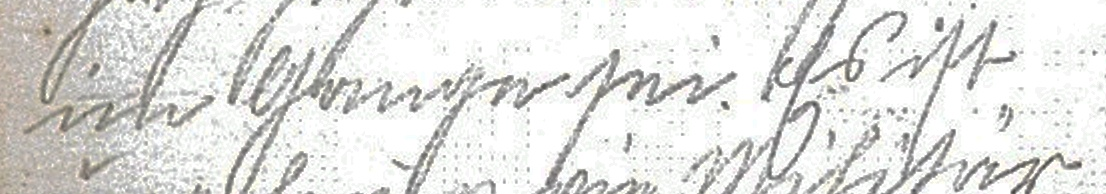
im Gange sei. Es ist
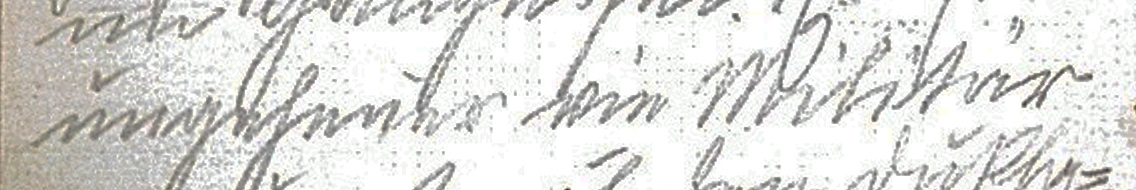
ungeheuer wie Militär
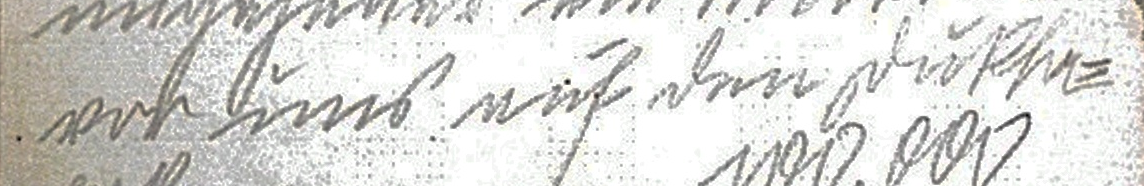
vor uns auf den Dukler-
